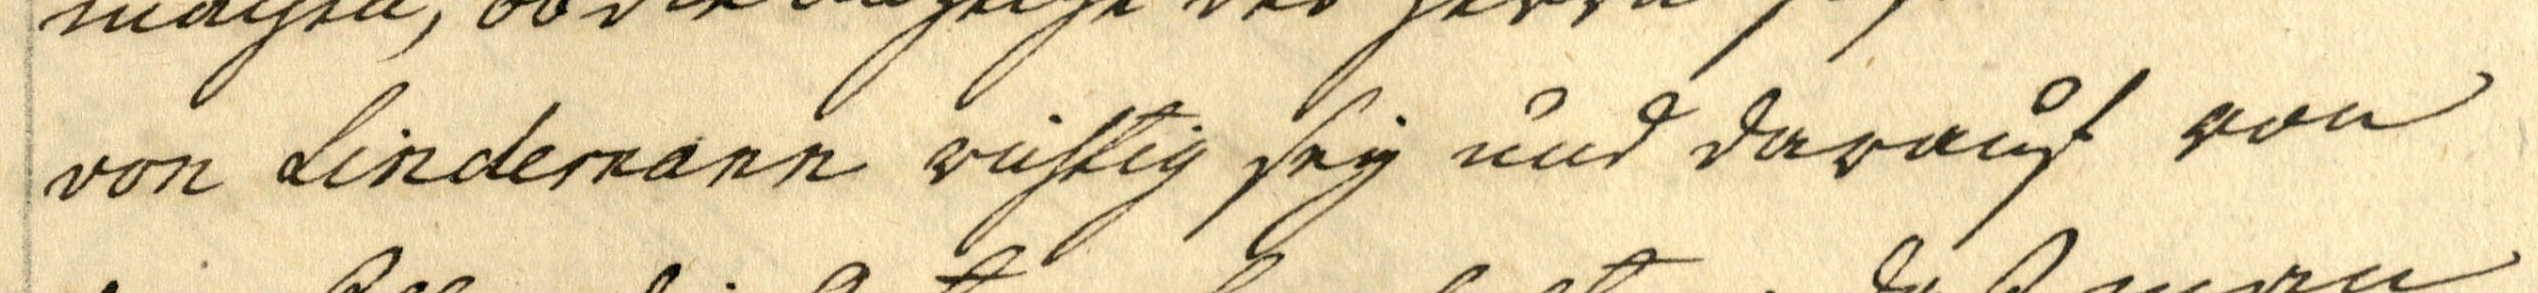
von Lindemann richtig seÿ und darauf von
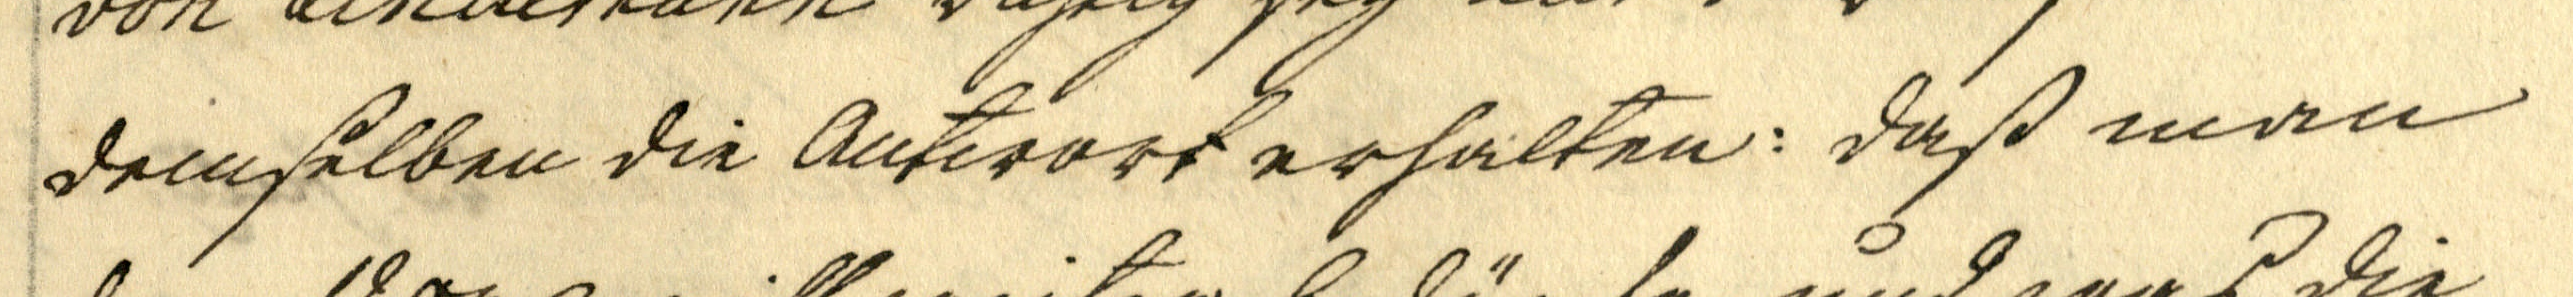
demselben die Antwort erhalten: daß man
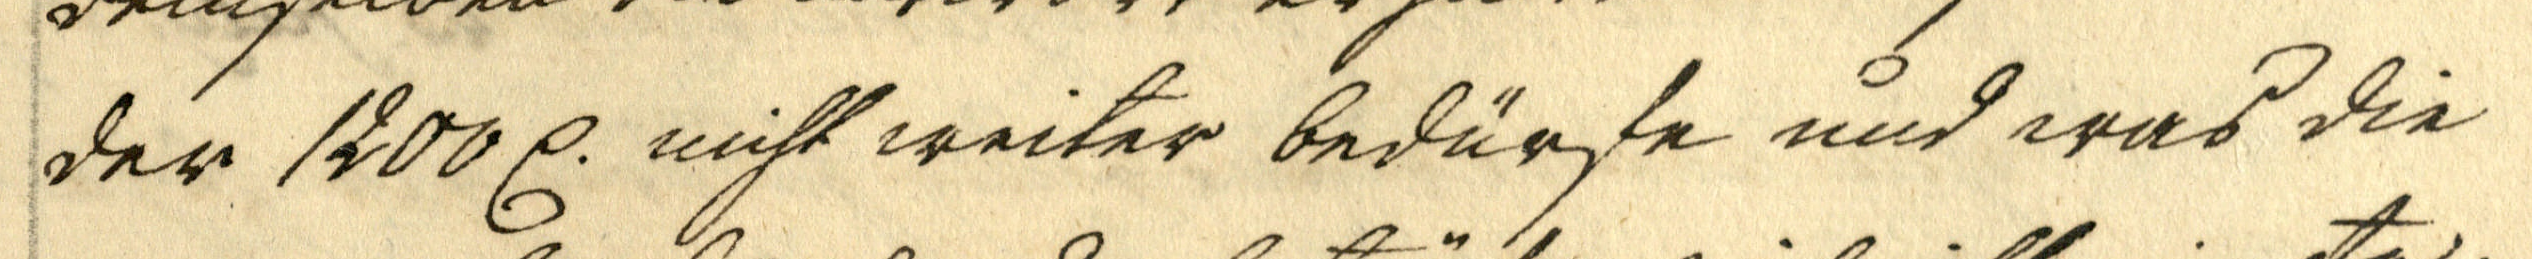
der 1200 l. nicht weiter bedürfe und was die
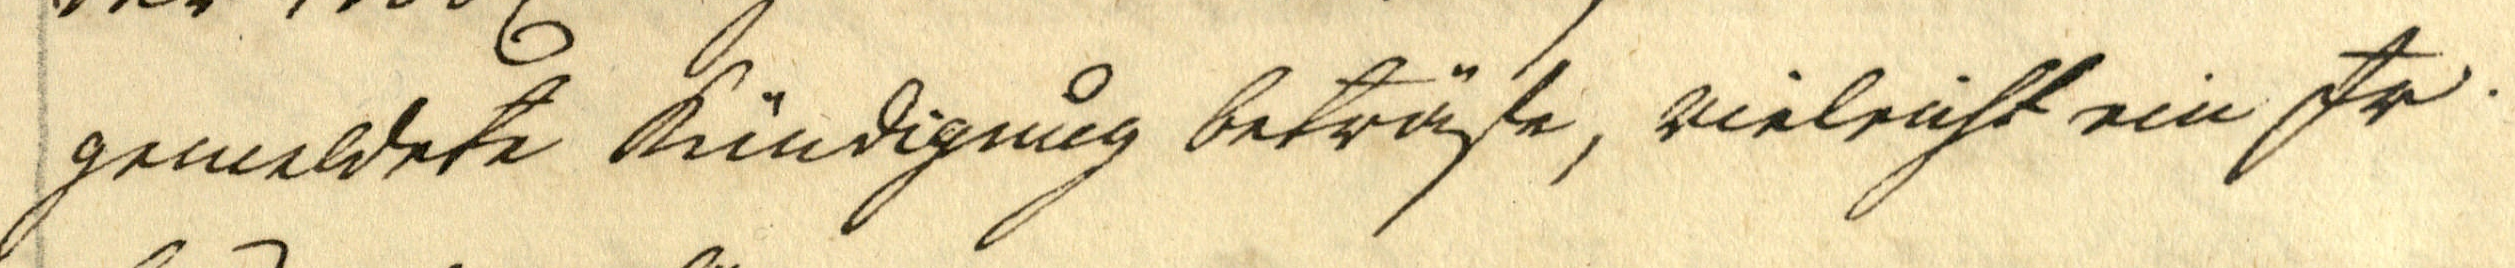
gemeldete Kündigung beträfe, vieleicht ein Ir¬
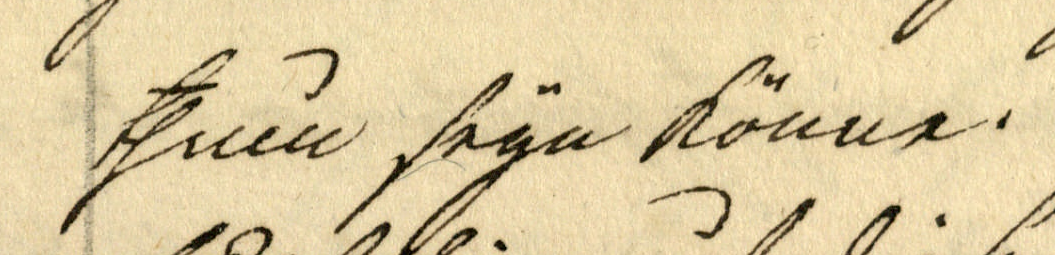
thum seÿn könne.
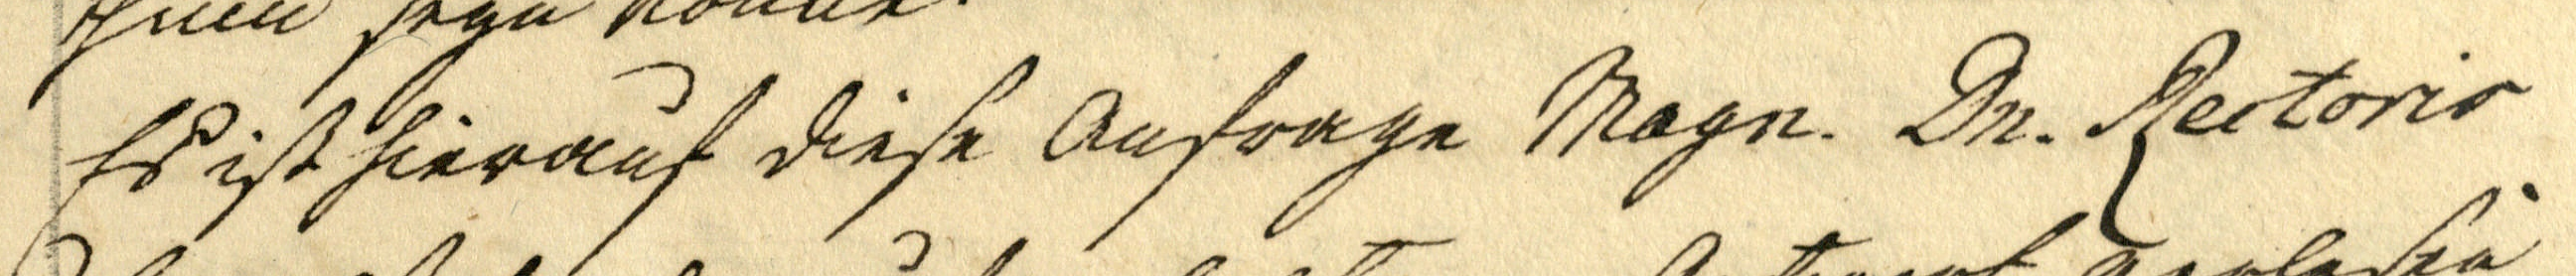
Es ist hierauf diese Anfrage Magn. Dn. Rectoris
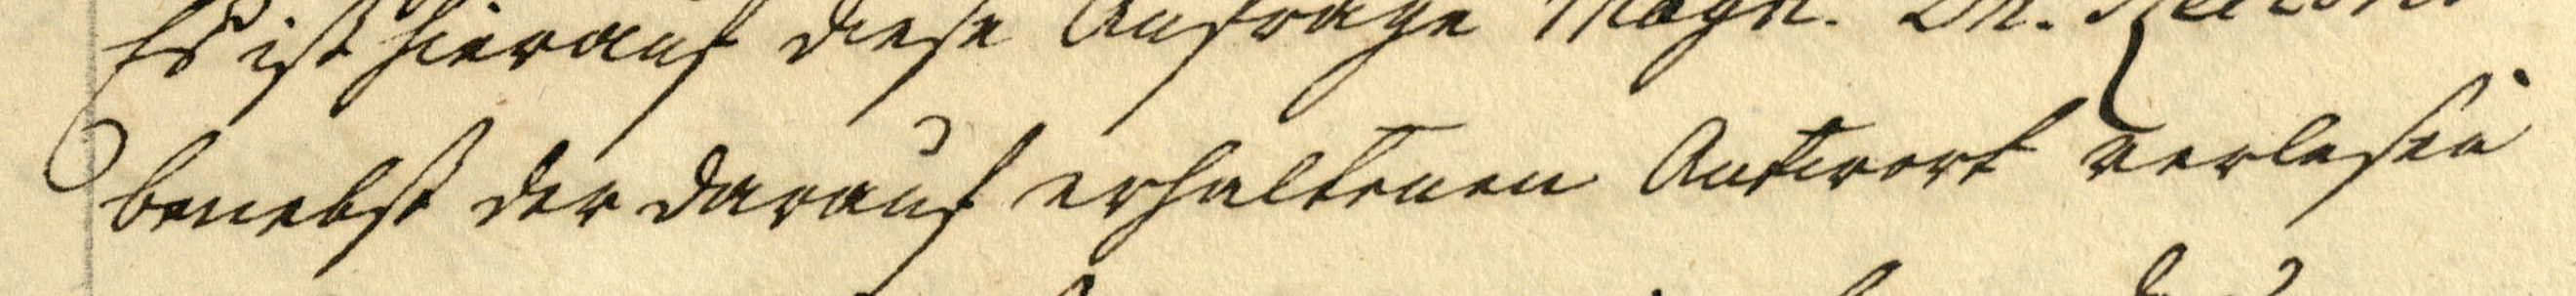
benebst der darauf erhaltenen Antwort verlesen
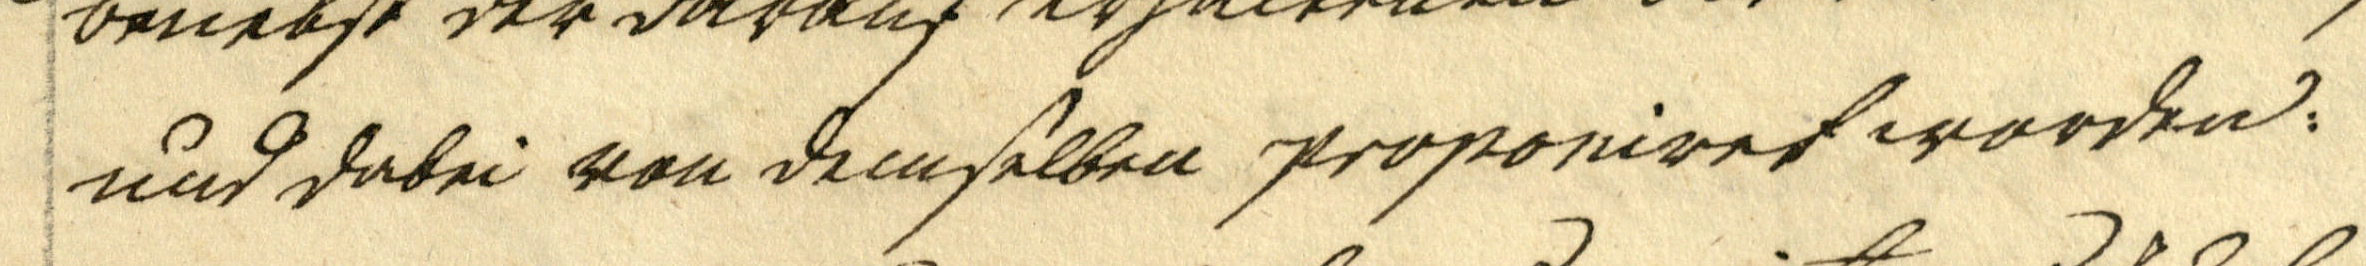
und dabei von demselben proponiret worden:
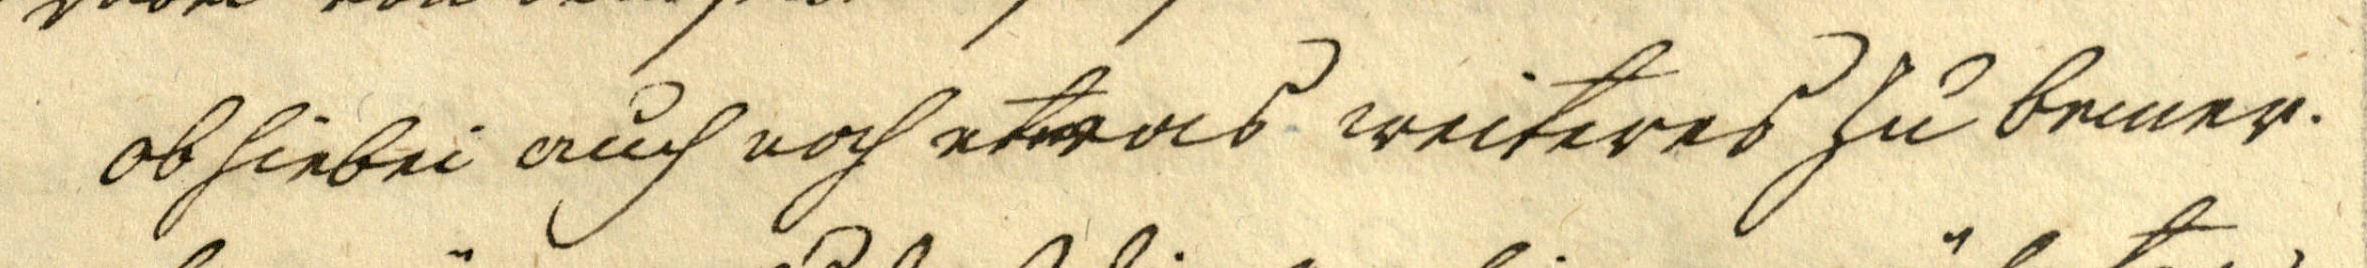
ob hiebei auch noch etwas weiteres zu bemer
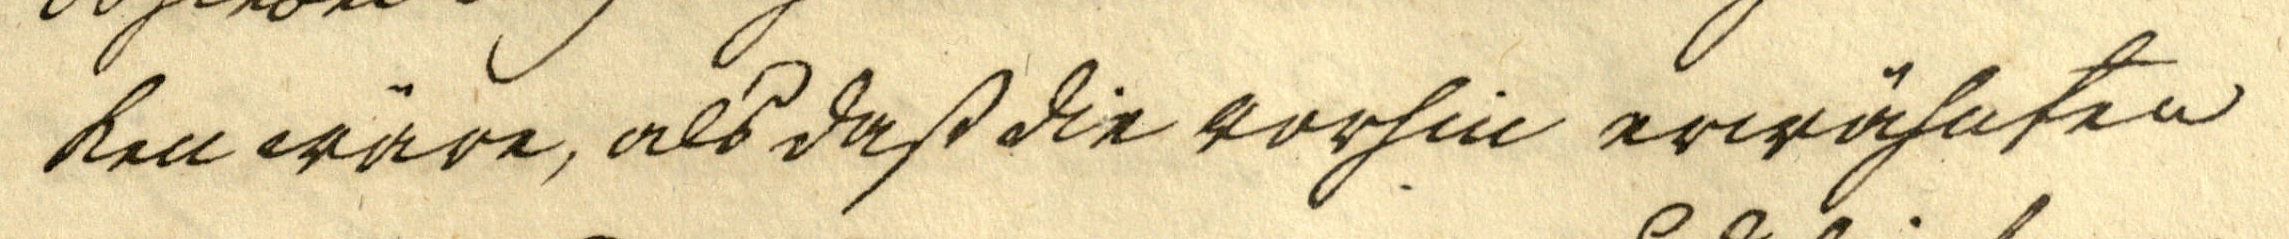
ken wäre, als daß die vorhin erwähnten
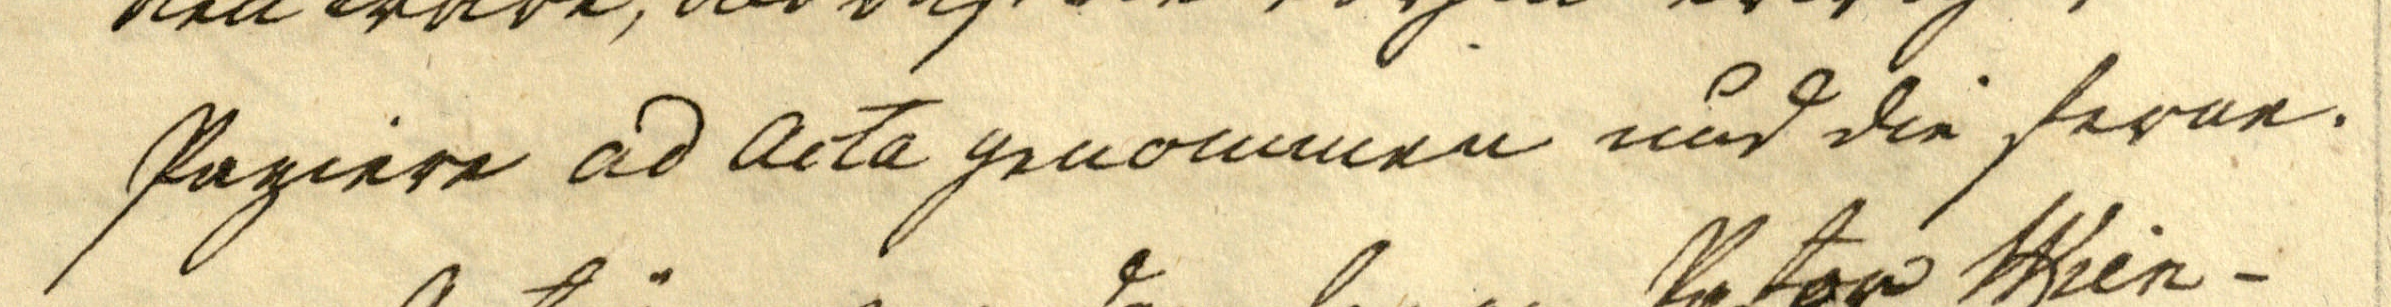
Papiere ad Acta genommen und die ferne¬
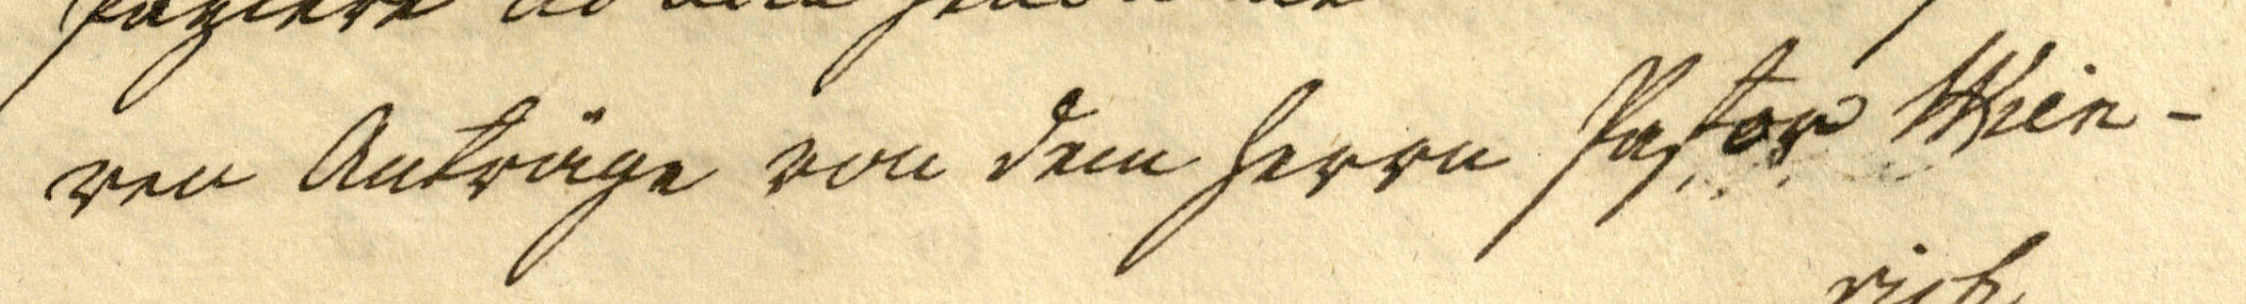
ren Anträge von dem Herrn Pastor Wien¬
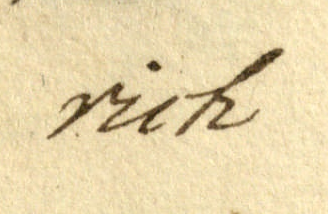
rich
